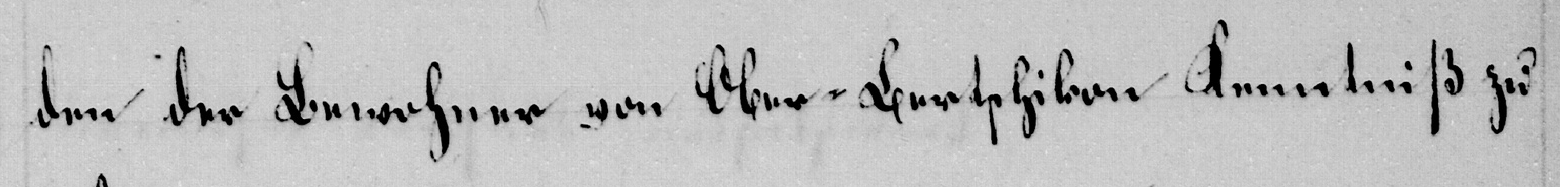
den der Bewohner von Ober-Bertschikon Kenntniß zu
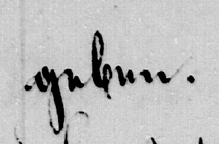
geben.
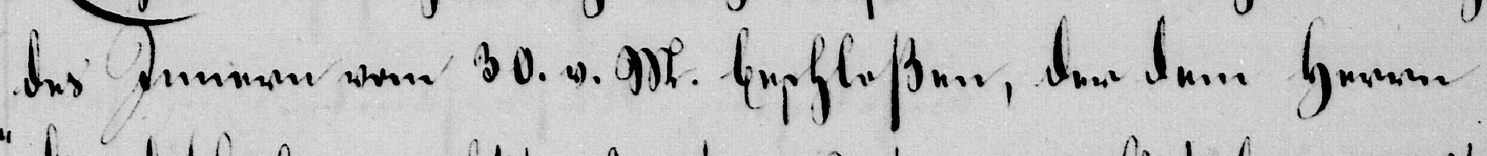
des Innern vom 30. v. M. beschloßen, der dem Herrn
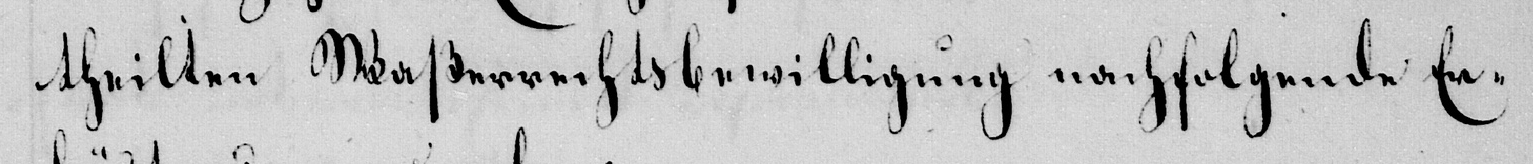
theilten Waßerrechtsbewilligung nachfolgende Er¬
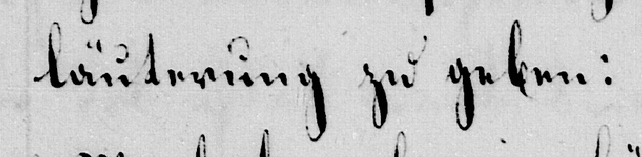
läuterung zu geben:
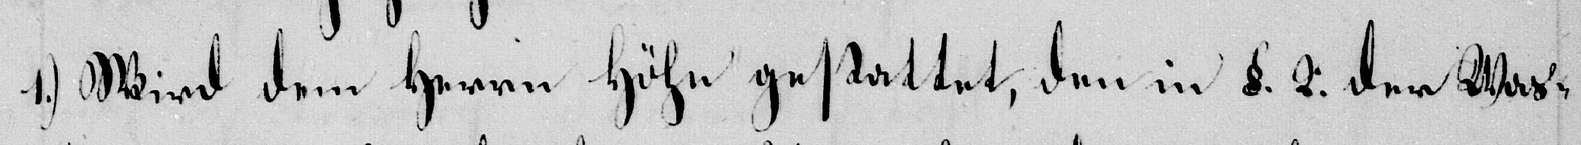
1.) Wird dem Herrn Höhn gestattet, dem in §. 2. der Waß¬
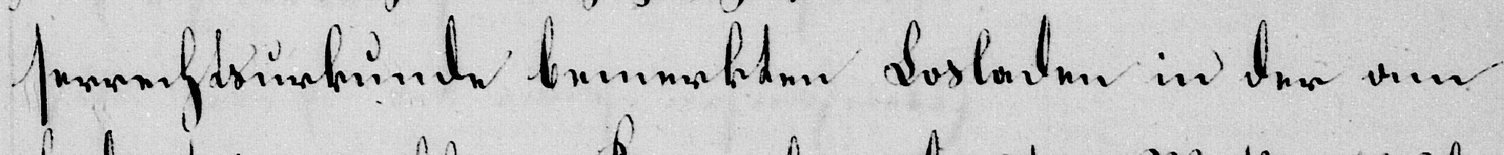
errechtsurkunde bemerkten Losladen in der am
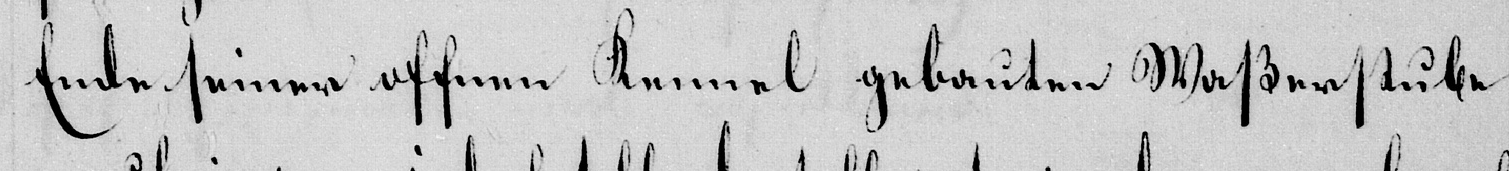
Ende seiner offnen Kennel gebauten Waßerstube
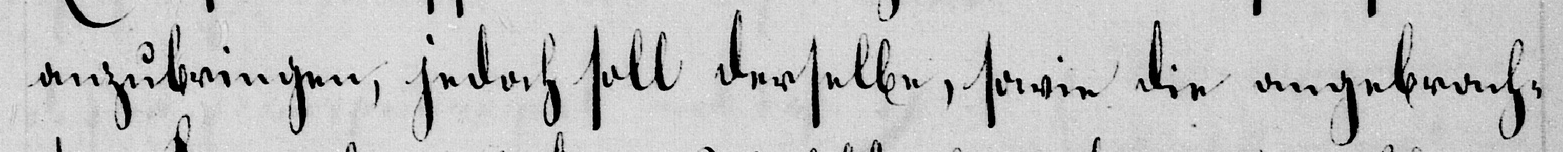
anzubringen, jedoch soll derselbe, sowie die angebrach¬
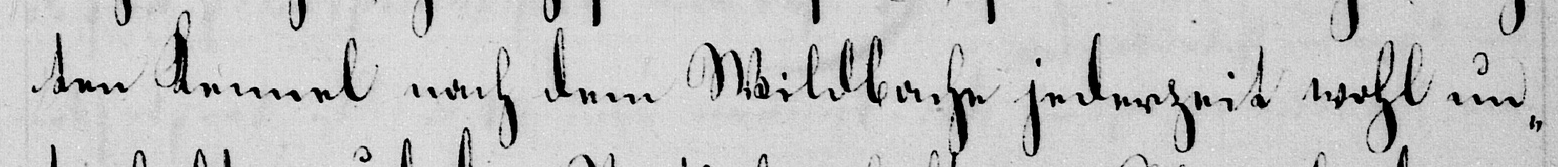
ten Kennel nach dem Wildbache jederzeit wohl un¬
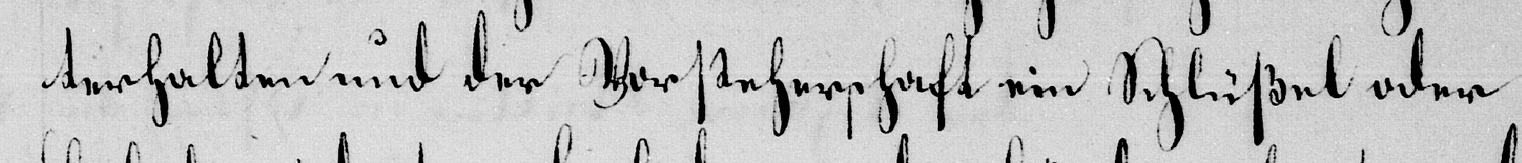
terhalten und der Vorsteherschaft ein Schlüßel oder
